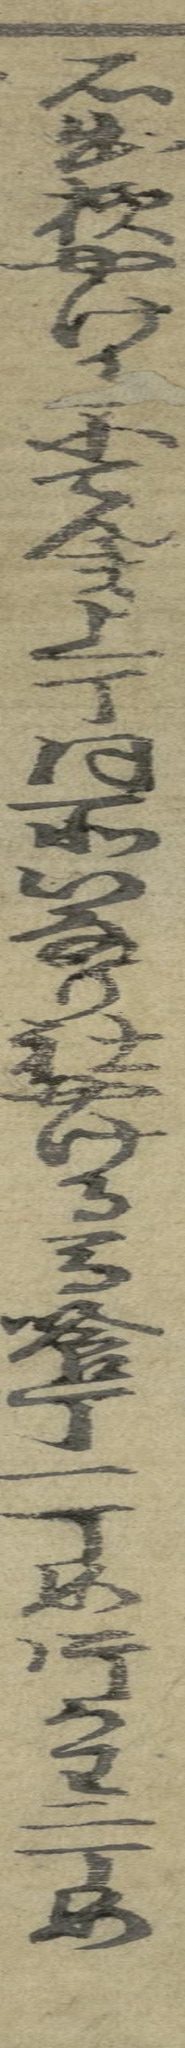石出様やける小てんま上丁同所いなり社やける馬喰丁一丁め片かわ二丁め
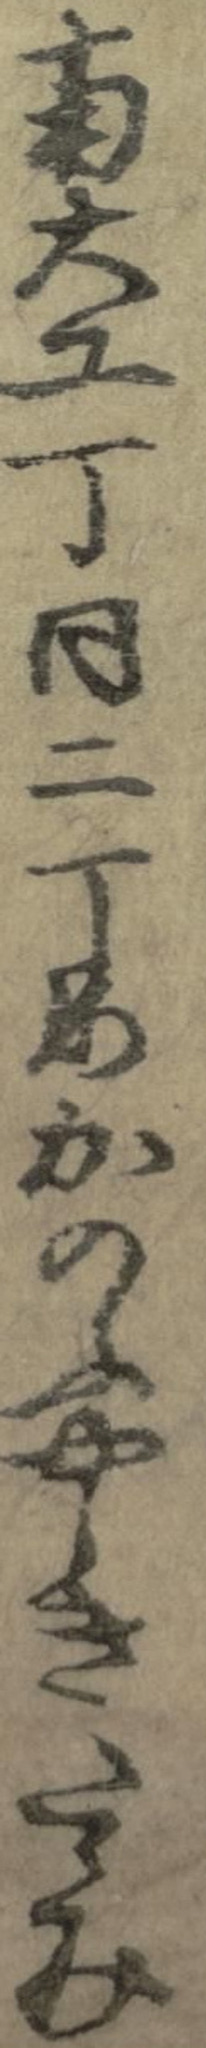南大工丁同二丁めかのふやしきたゝみ
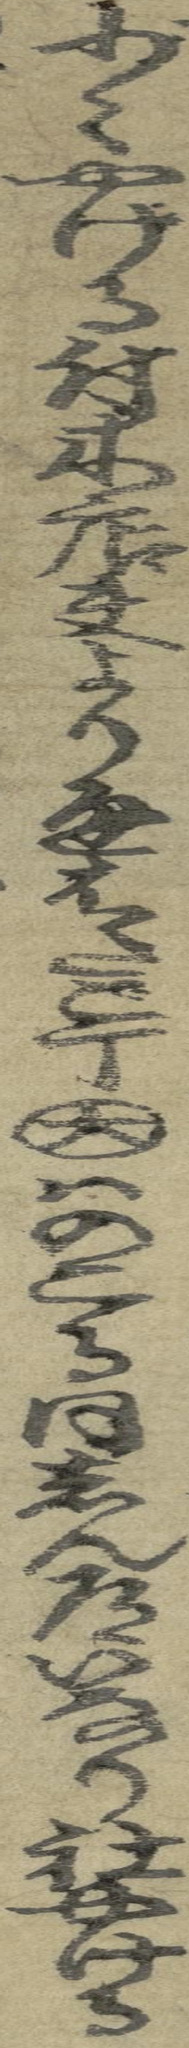少々やける付木店夫より通はたご丁大丸ハのこる同しん道いなり社やける
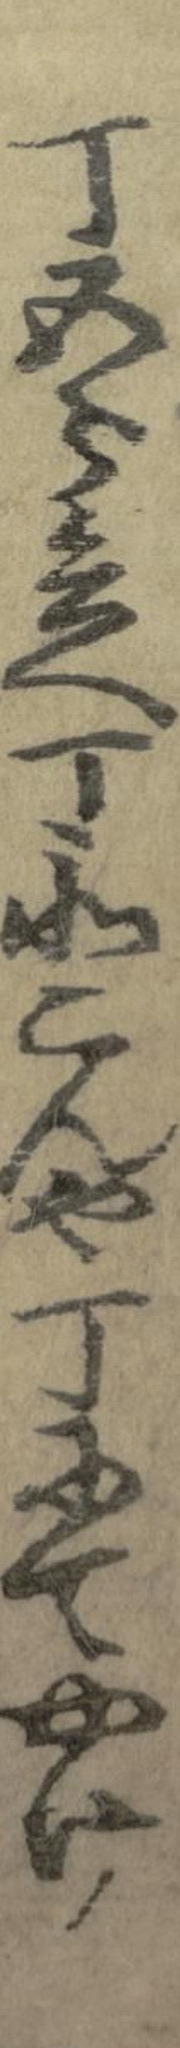丁五郎兵へ丁北こんや丁にてやけ
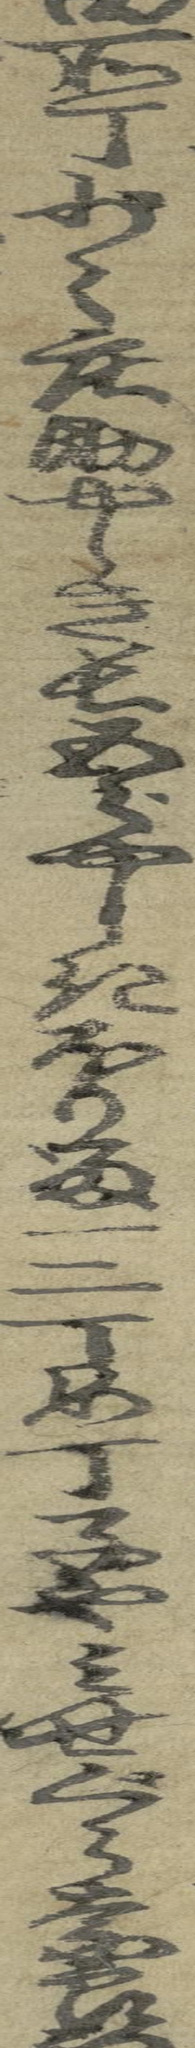田所丁少々庄助やしき長五郎やしきほり留一二丁め丁子やミせぐら奈良や
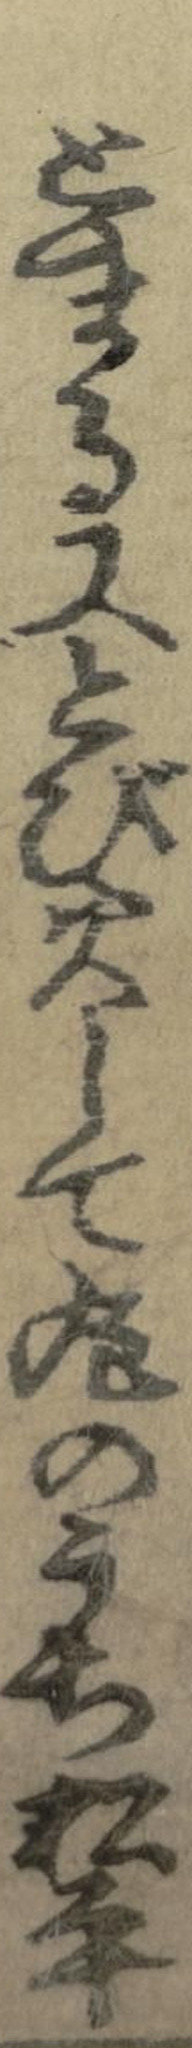とまる又とび火して丸のうち松平
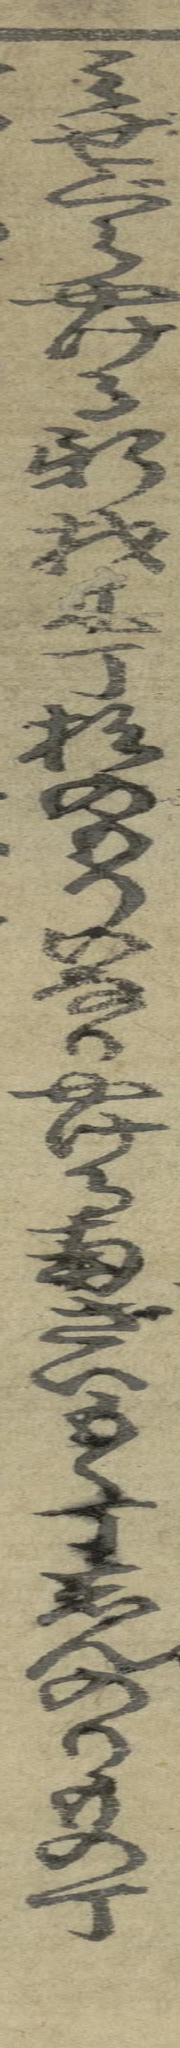ミせぐらやける新材木丁杉のもりいなりやける南ざいもく丁しんのりもの丁
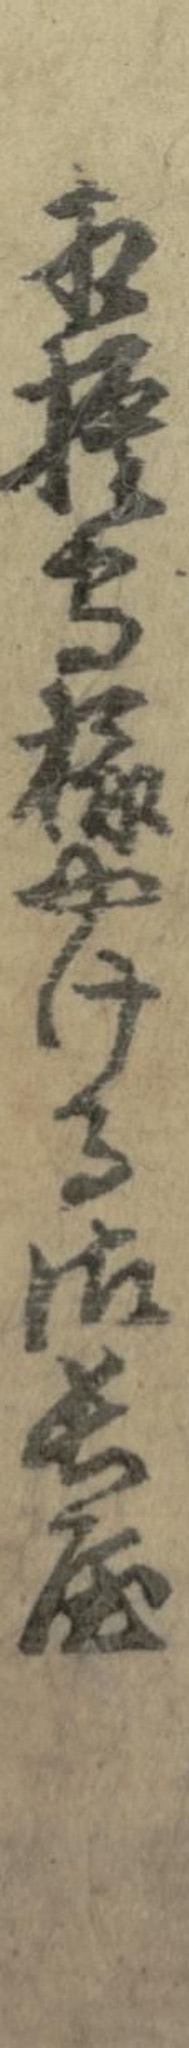相模守様やける御長屋
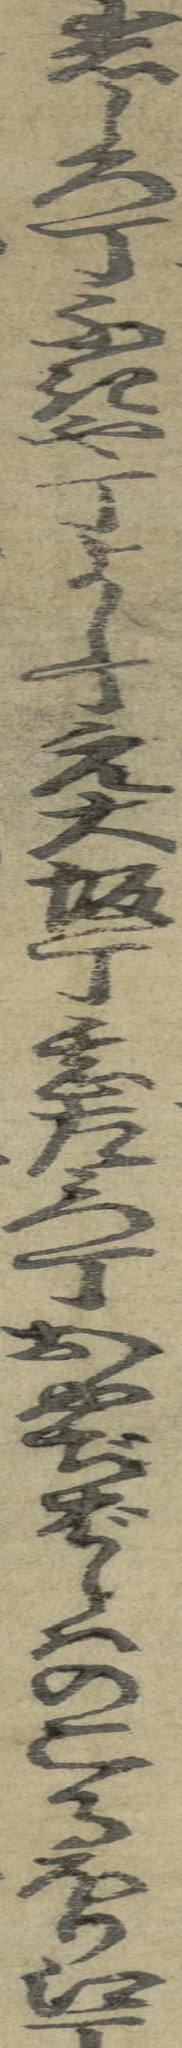岩しろ丁ふきや丁よし丁元大坂丁甚左衛門丁おやぢばしハのこるほり江丁
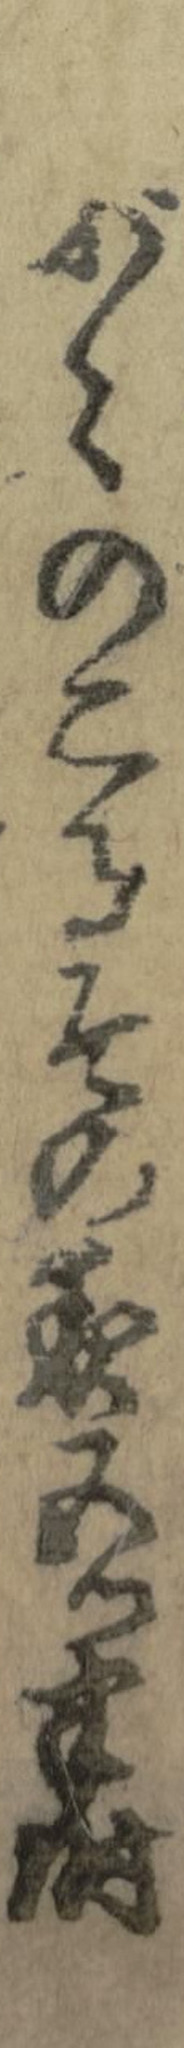少々のこるその夜五ッ半時
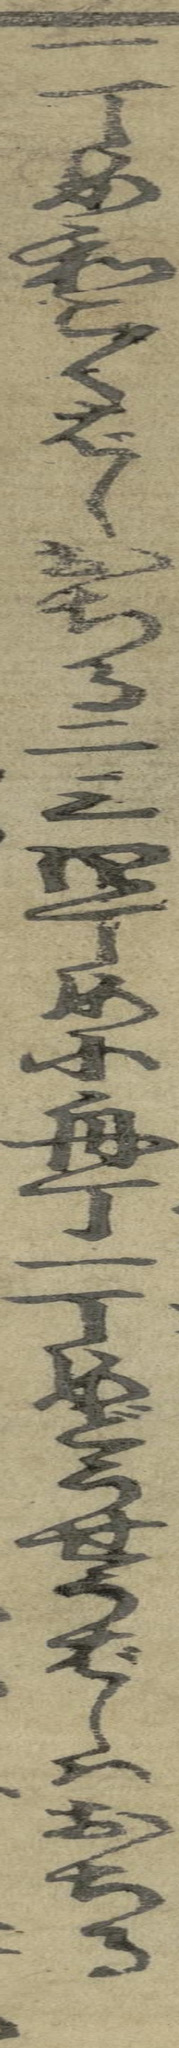一丁め和こく橋おちる二三四丁め小舟丁一丁めどうせうばしハおちる
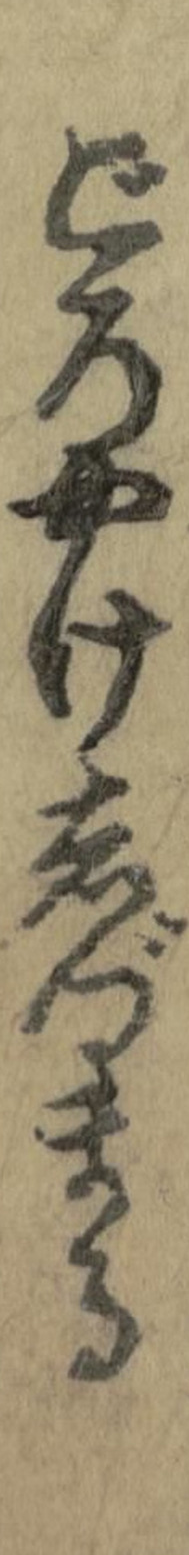ごろやけしずまる
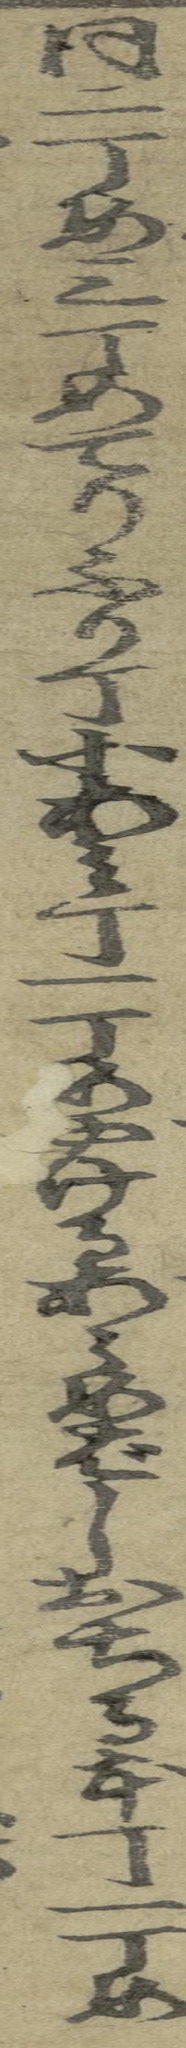同二丁め三丁めてりふり丁小あミ丁一丁めやけるあらめばしおちる本丁一丁め
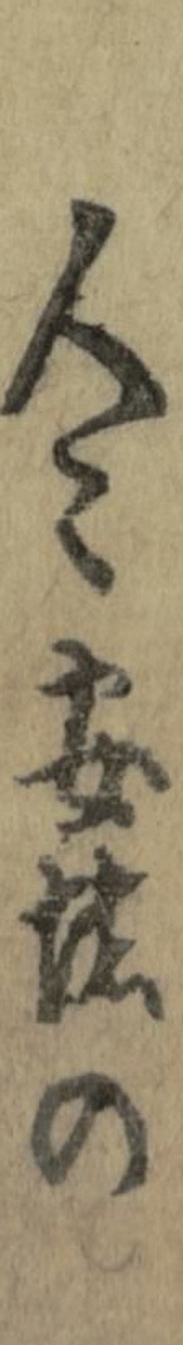人々安堵の
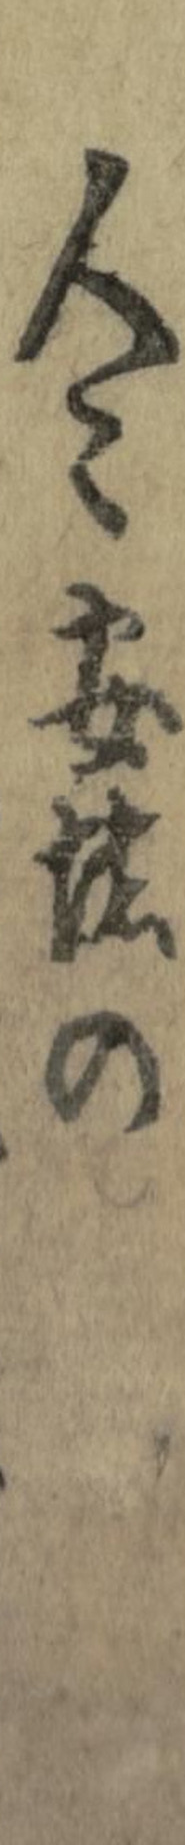人々安堵の
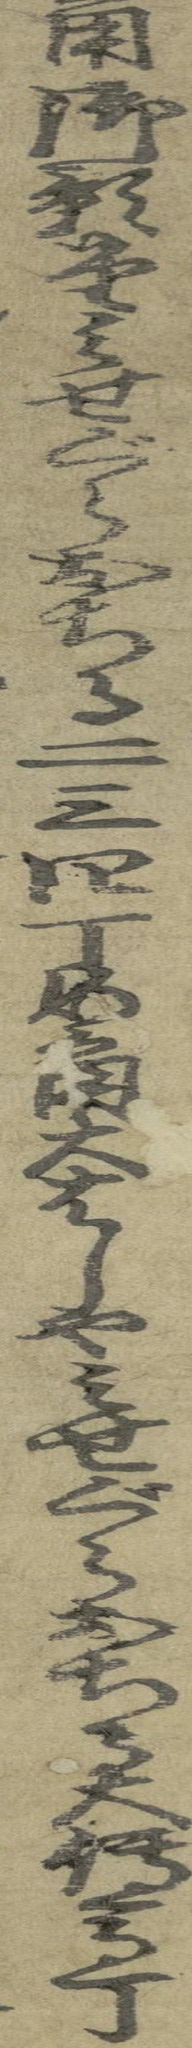角御新堂ミせぐらおちる二三四丁め角大はしやミせぐらおちる大伝馬丁
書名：焼場方角明細圖
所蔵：東京大学地震研究所図書室 Earthquake Research Institute Library, The University of Tokyo, JAPAN
